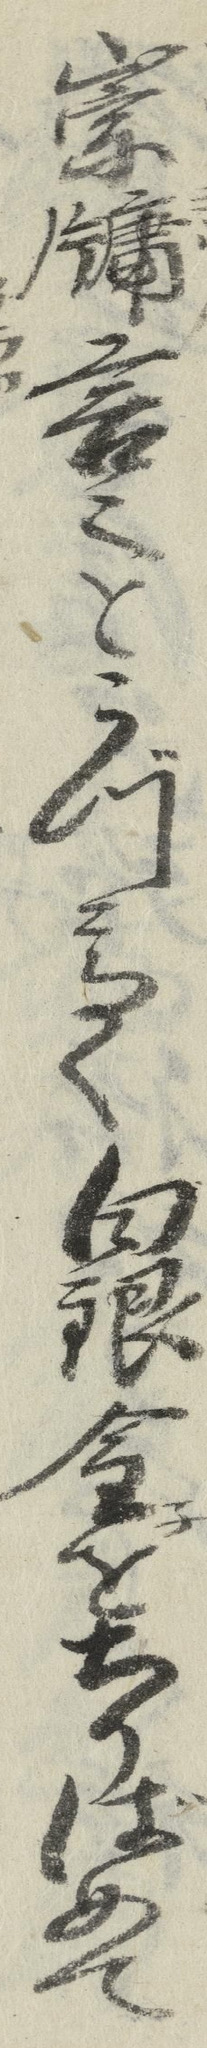崇牅言之とうづ高く白銀金子をちりばめて
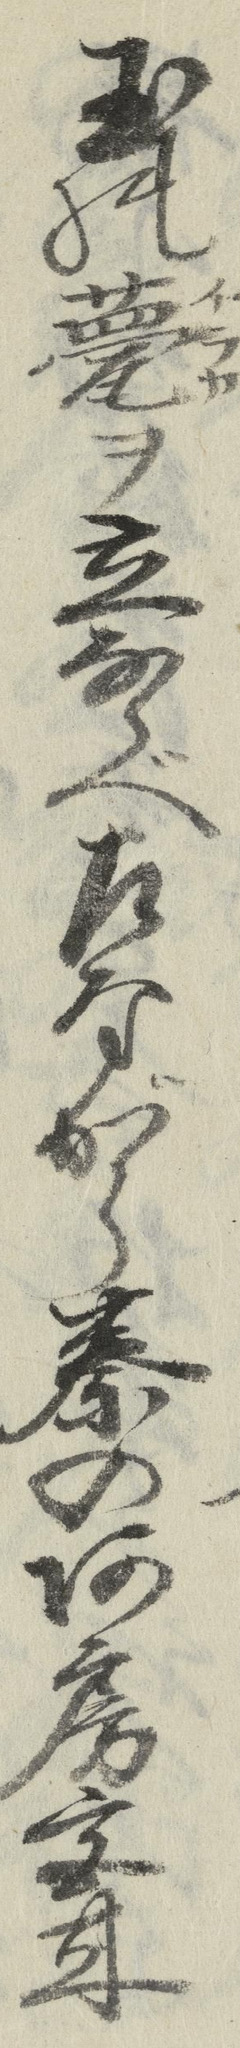玉の甍ヲ立ならべ左ながら秦の阿房宮来
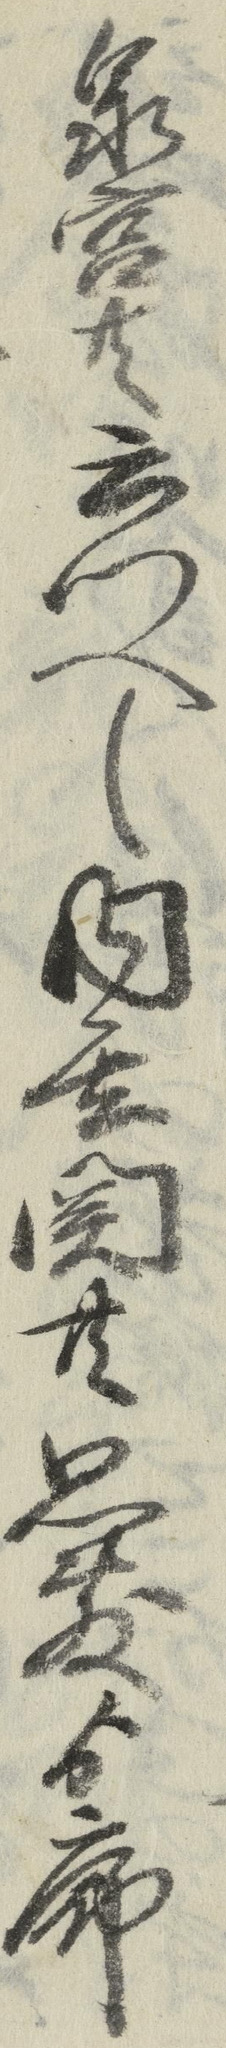泉宮共云つへし内玄関共思敷ゟ廊
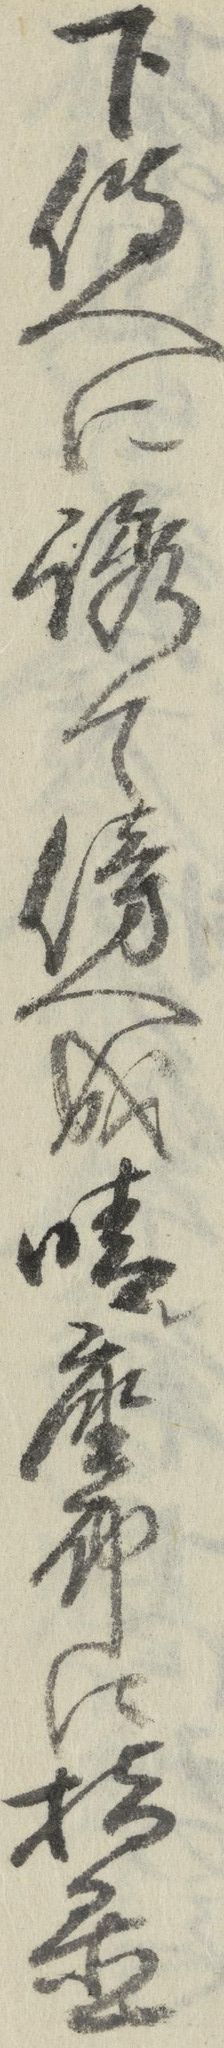下傳へに誘て傍へ成晴座布に指置

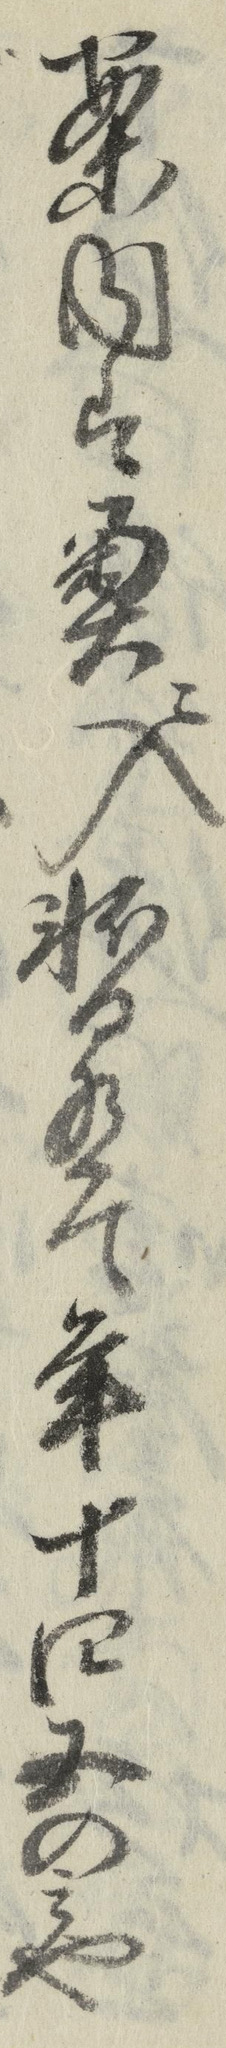案内す奥に入暫有て年十四五のみや
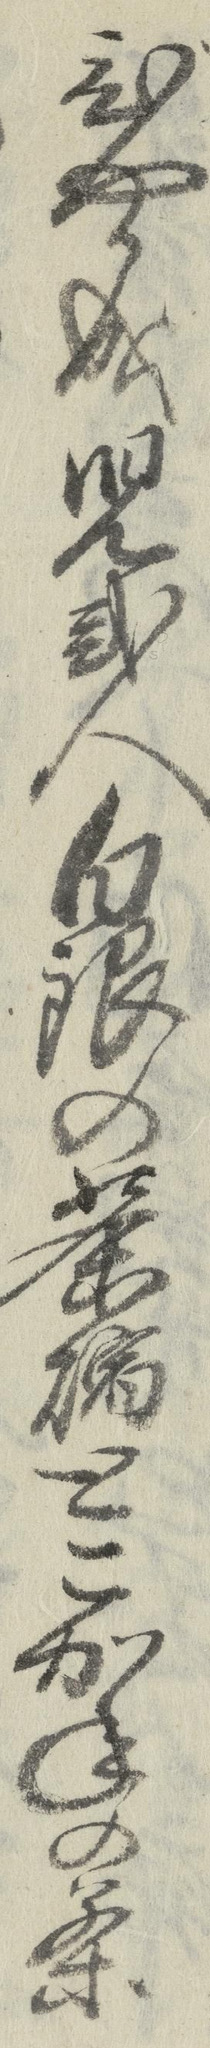びやか成児弐人白銀の茶碗とこがねの茶
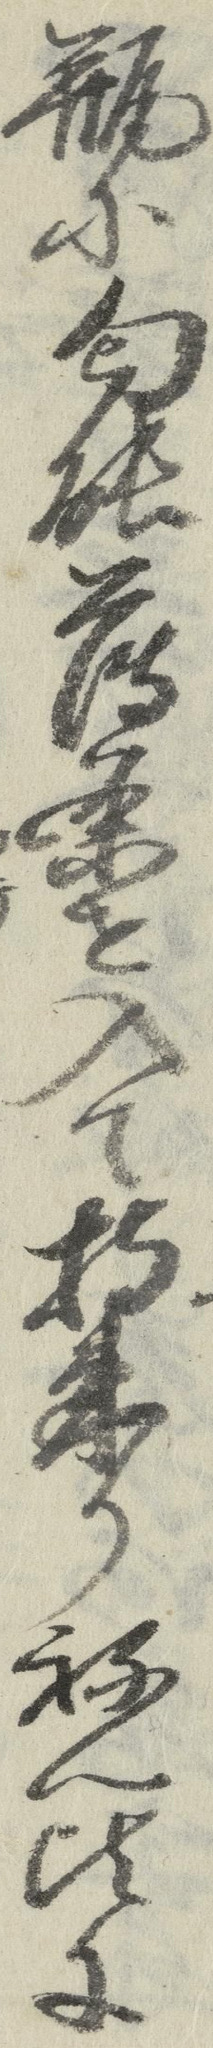瓶に匂能薄茶を入て持来りねん頃に
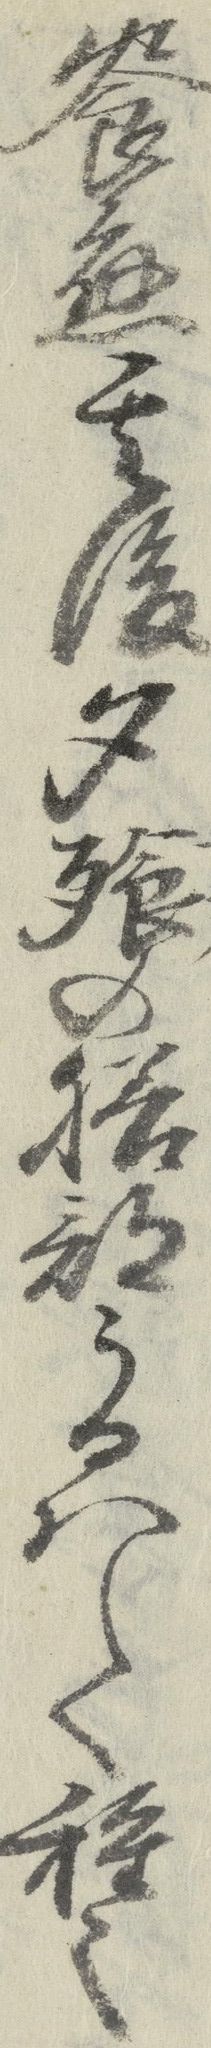饗応其後夕餐の膳部うるはしく種々
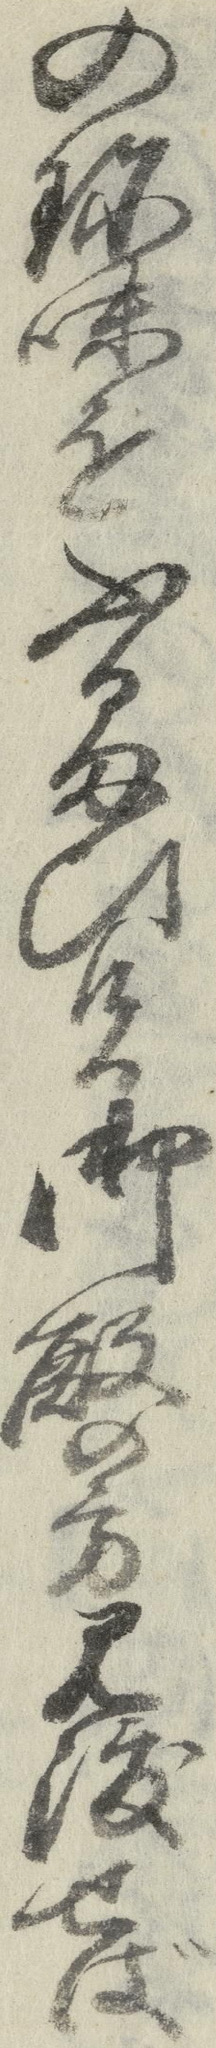の珍味をふるまひける御殿の方見渡せば
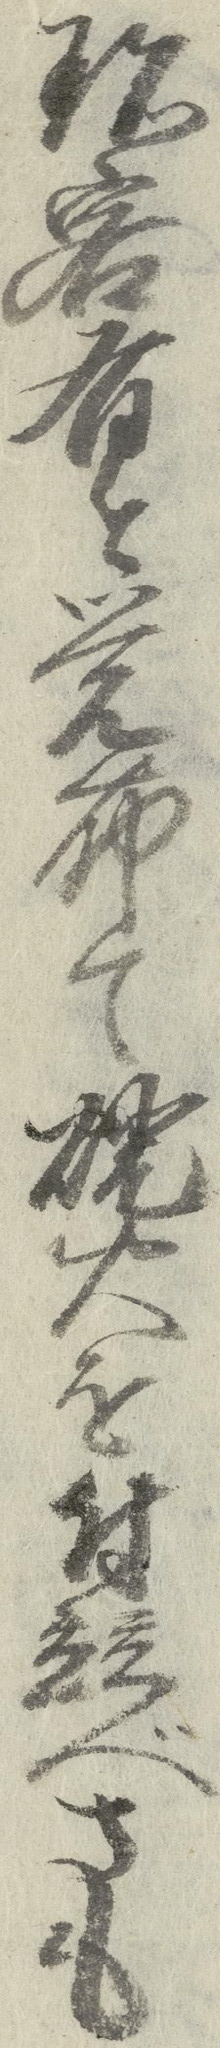珍客有と覚布て燈火を付並べさも
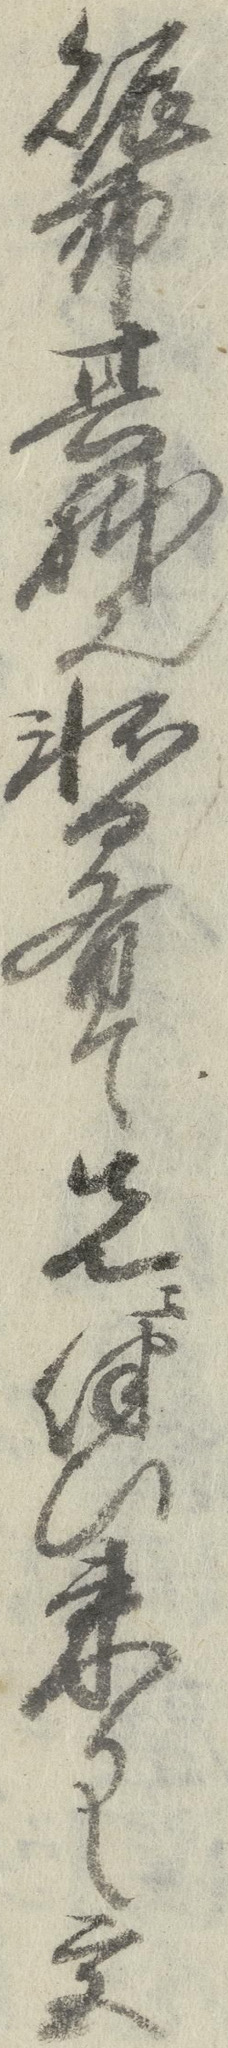賑布其躰之暫有て先に伴ひ来りし宮
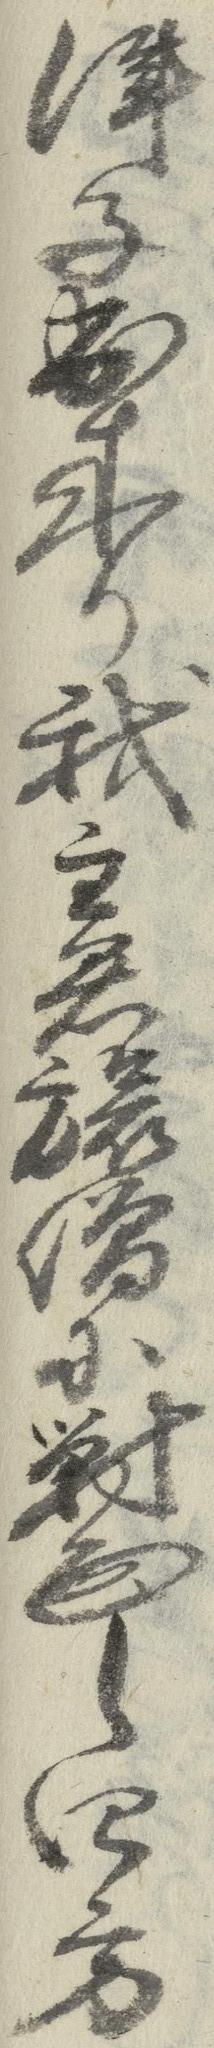津子出来り我主君旅僧に對面し四方
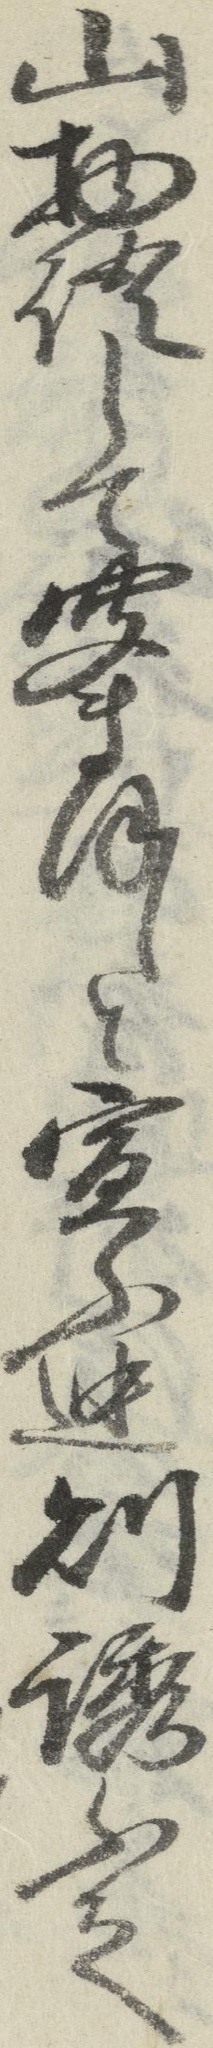山物語して聞まほしと宣ふ迚則誘ふて
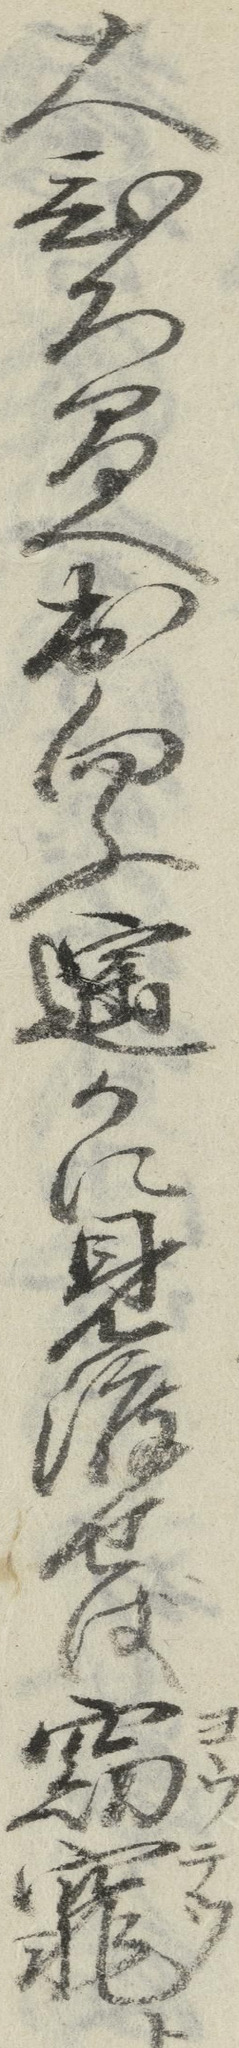大ひろ間へ出向ふ遙かに見渡せば窈宨
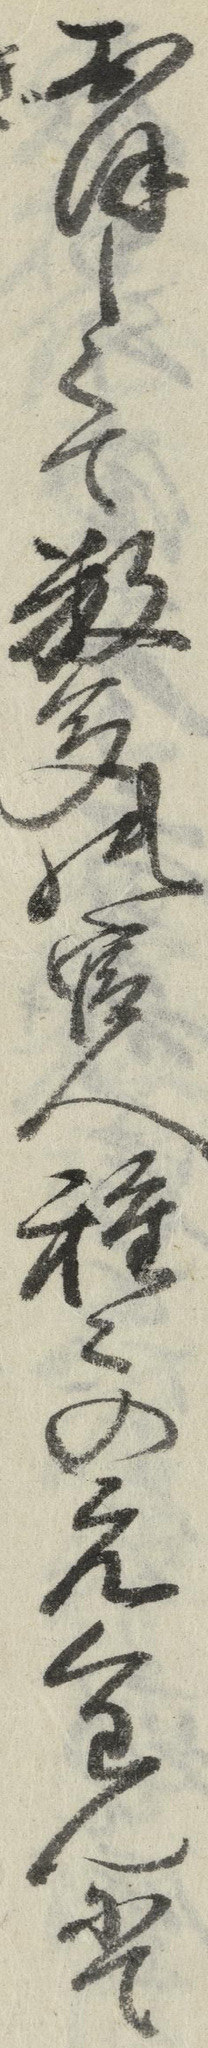おほしくて数多の官人種々の元くわんにて
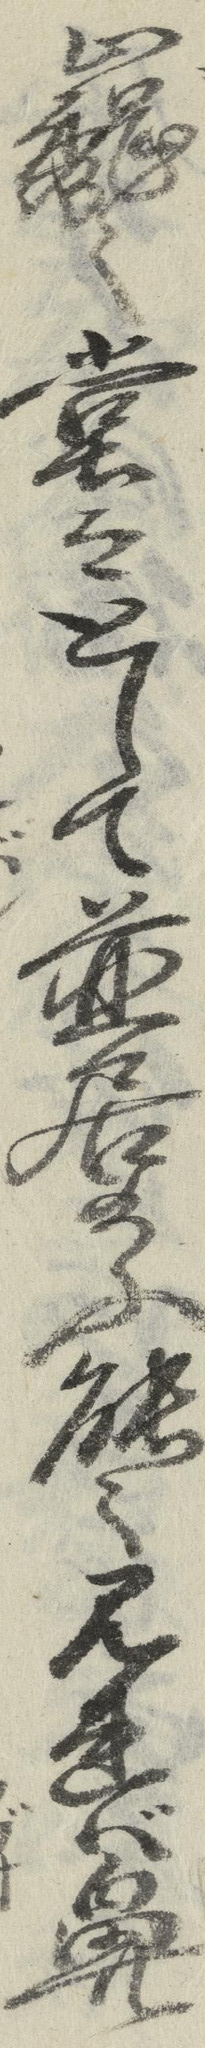巍之堂々として並居給ふ能く見れば鼻
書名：浅間大焼騒動記　上
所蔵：東京大学地震研究所図書室 Earthquake Research Institute Library, The University of Tokyo, JAPAN
